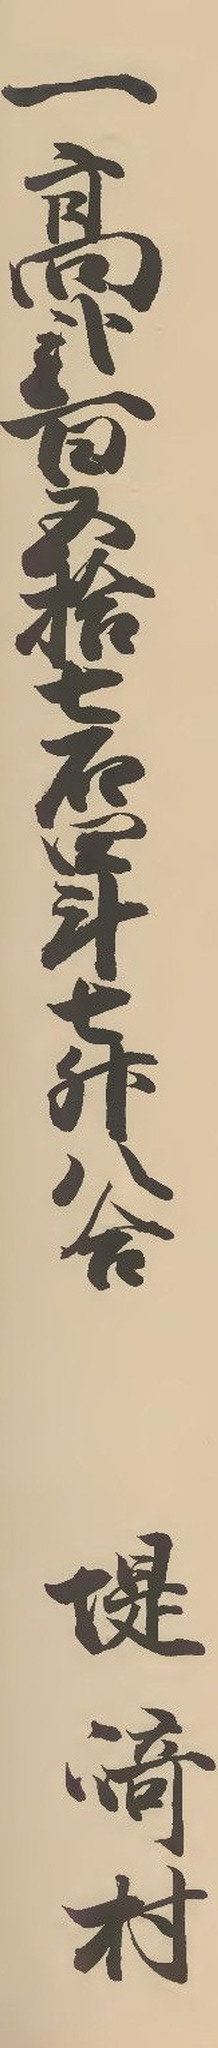一高弐百五拾七石四斗七升八合堤崎村
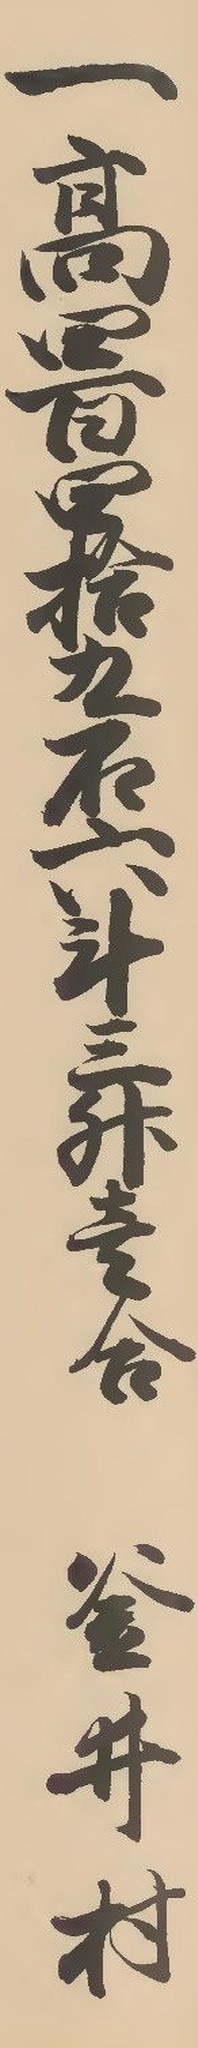一高四百四拾九石六斗三升壱合釜井村
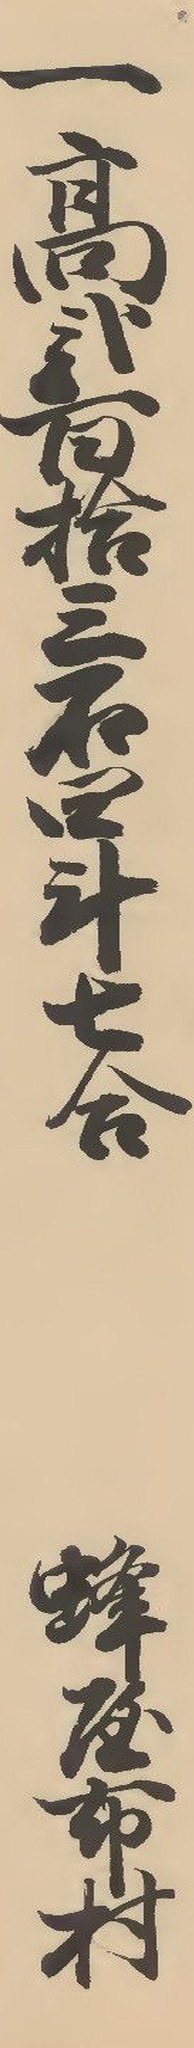一高弐百拾三石四斗七合蜂屋布村
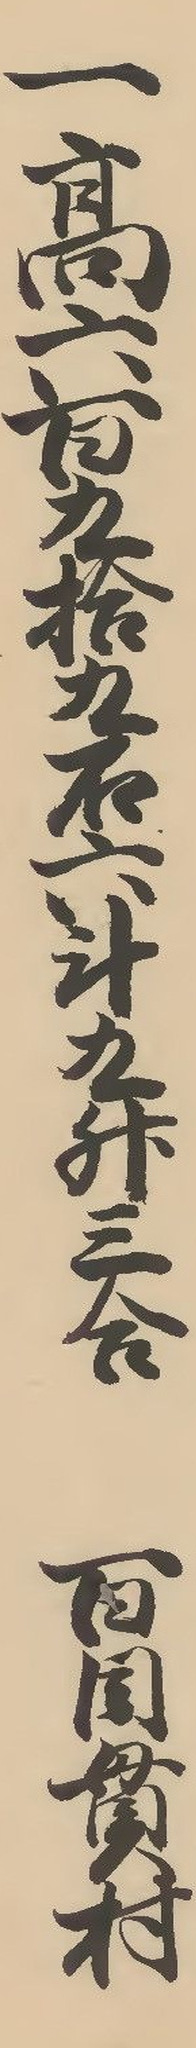一高六百九拾九石六斗九升三合百目貫村

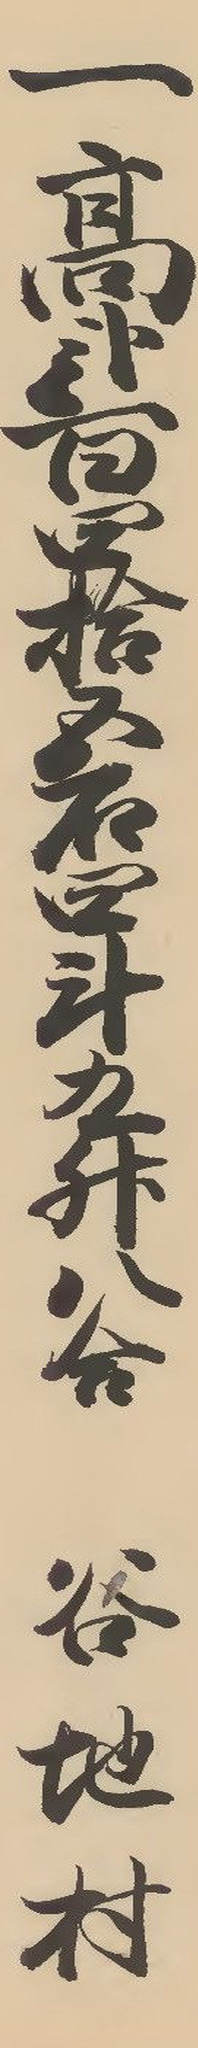一高弐百四拾五石四斗九升八合谷地村
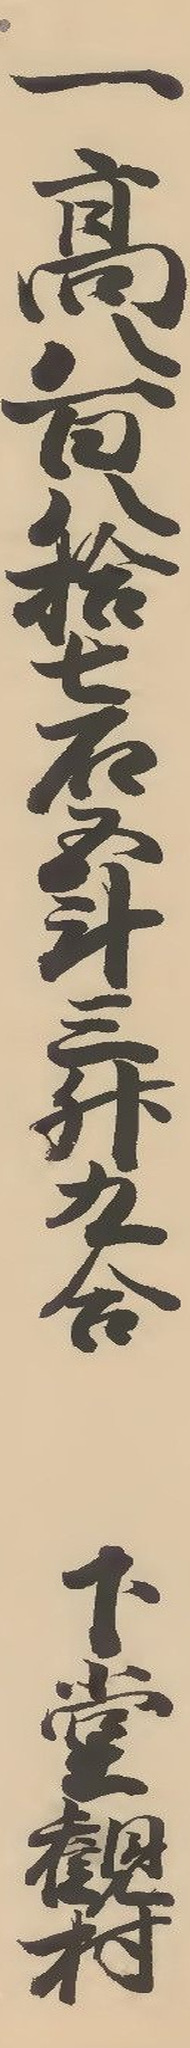一高八百八拾七石五斗三升九合下堂観村
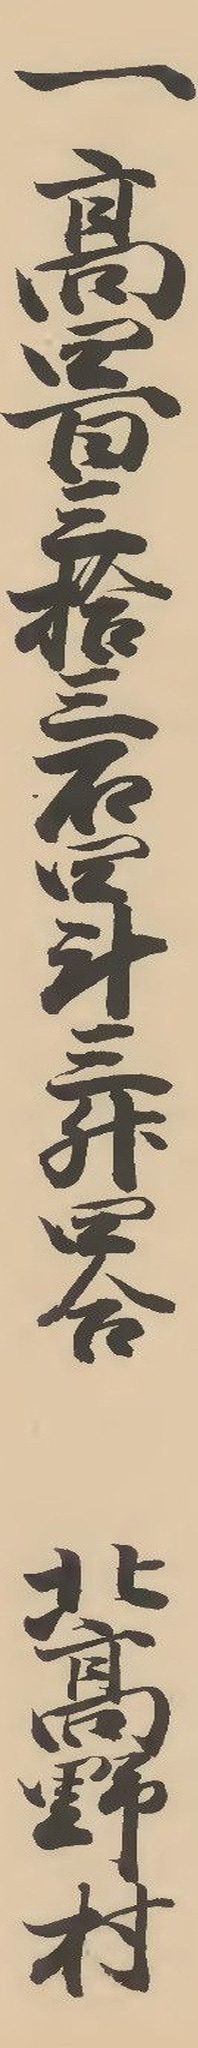一高四百三拾三石四斗三升四合北高野村
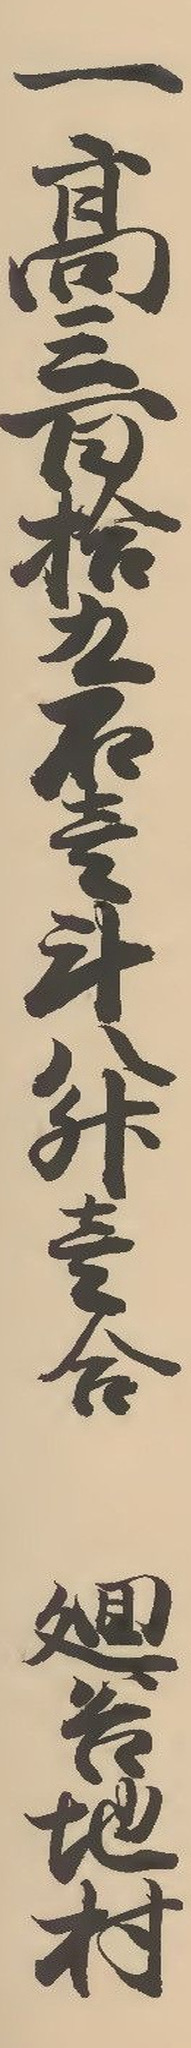一高三百拾九石壱斗八升壱合廻谷地村
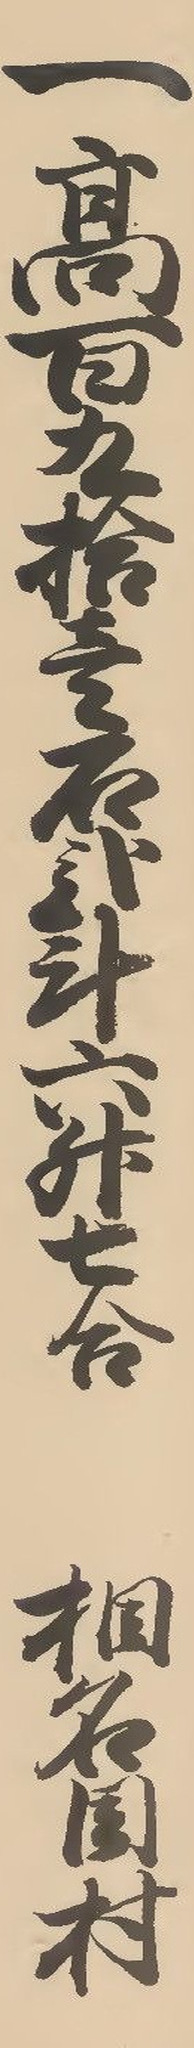一高百九拾壱石弐斗六升七合相名目村
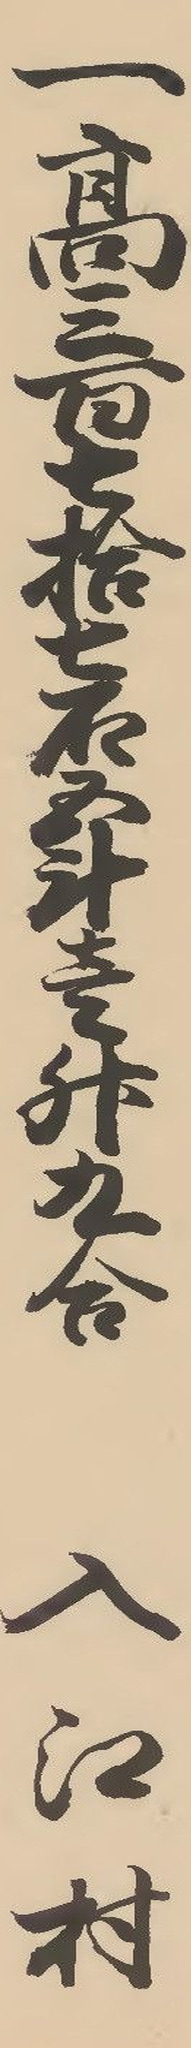一高三百七拾七石五斗壱升九合入江村
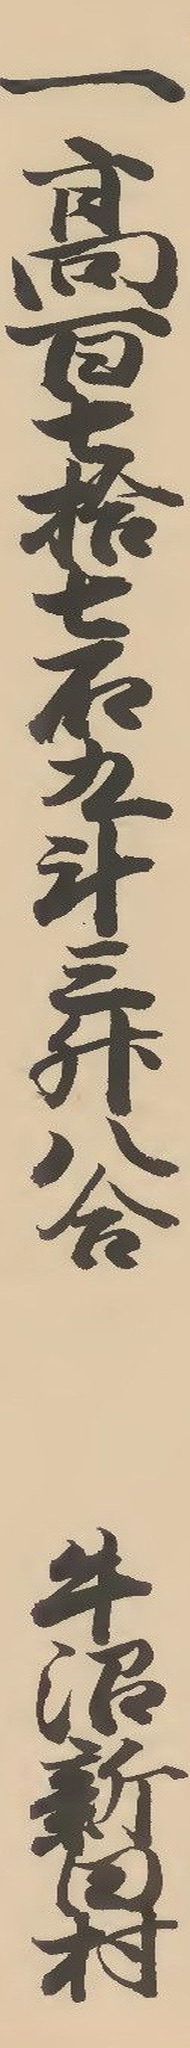一高百七拾七石九斗三升八合牛沼新田村
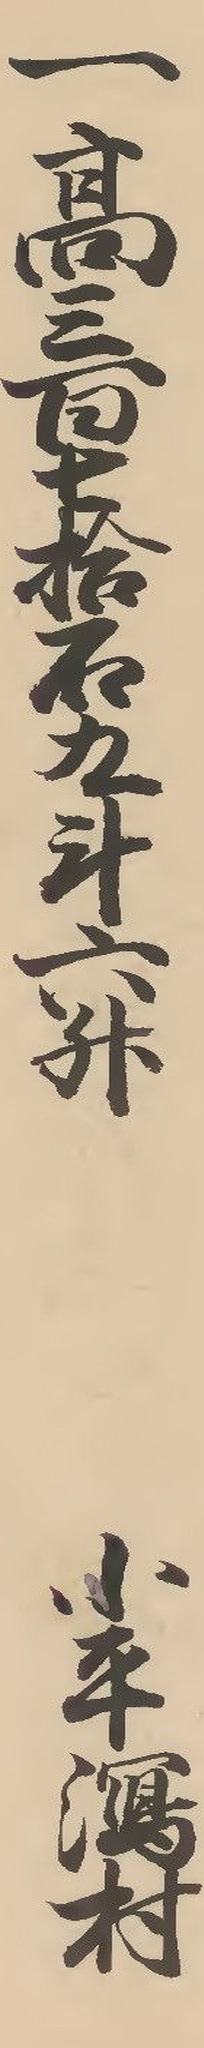一高三百七拾石九斗六升小平潟村

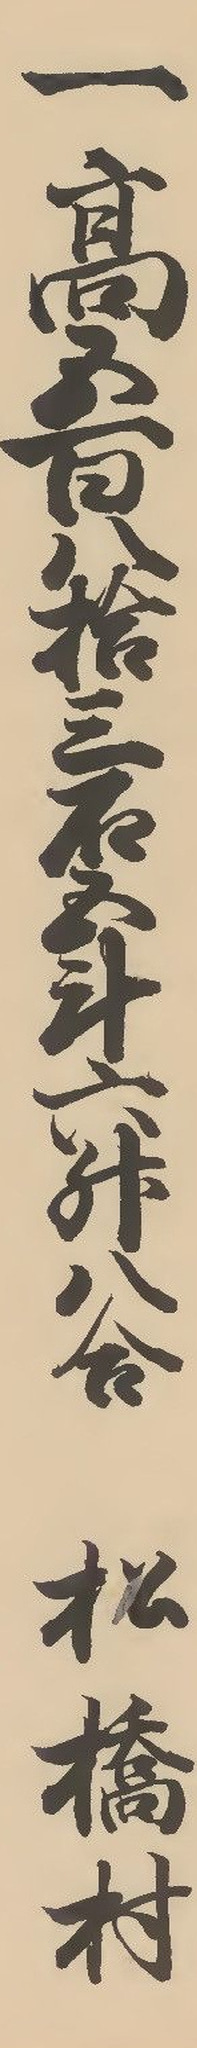一高五百八拾三石五斗六升八合松橋村
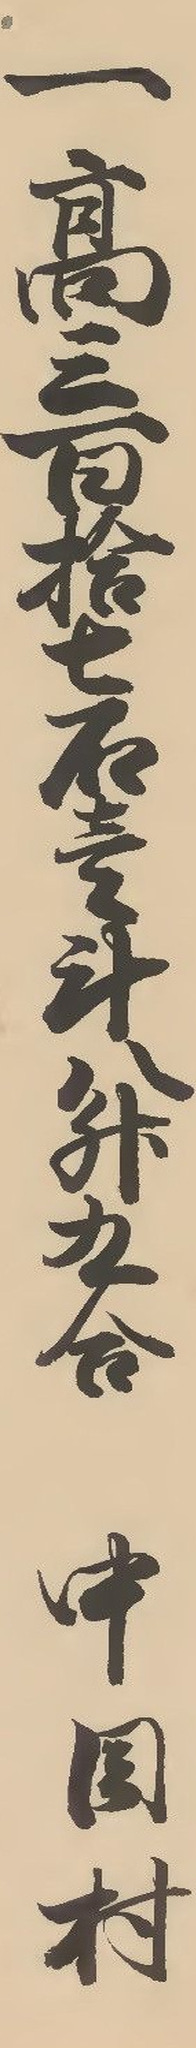一高三百拾七石壱斗八升九合中目村
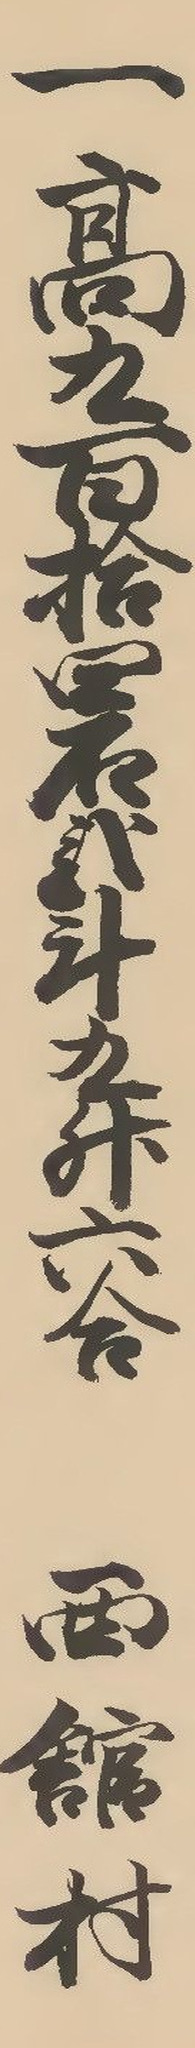一高九百拾四石弐斗九升六合西館村
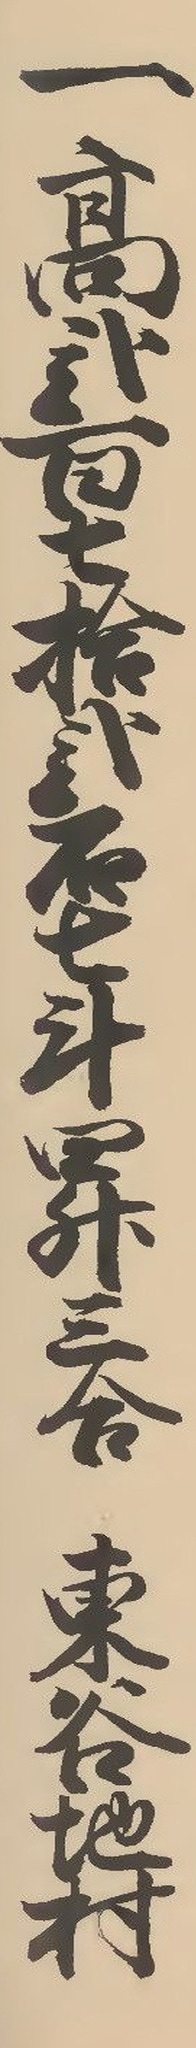一高弐百七拾弐石七斗四升三合東谷地村
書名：陸奥国郷帳　１
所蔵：国立公文書館 National Archives of Japan
